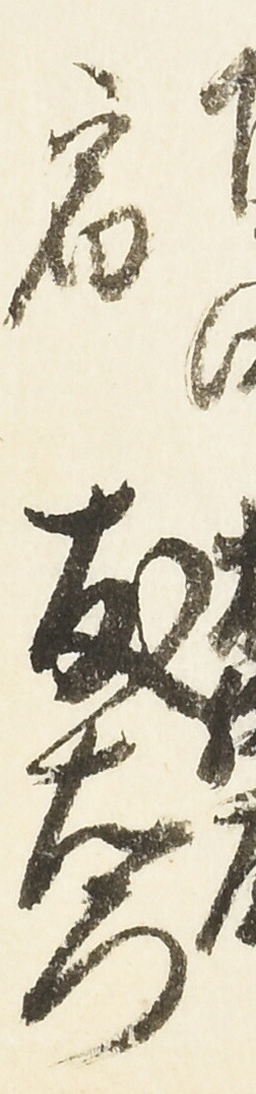宿友右衛門
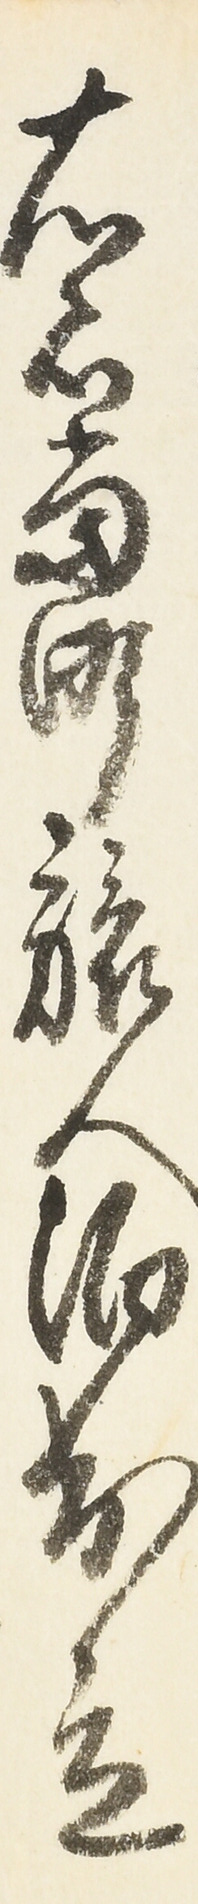右者当町旅人泊出立
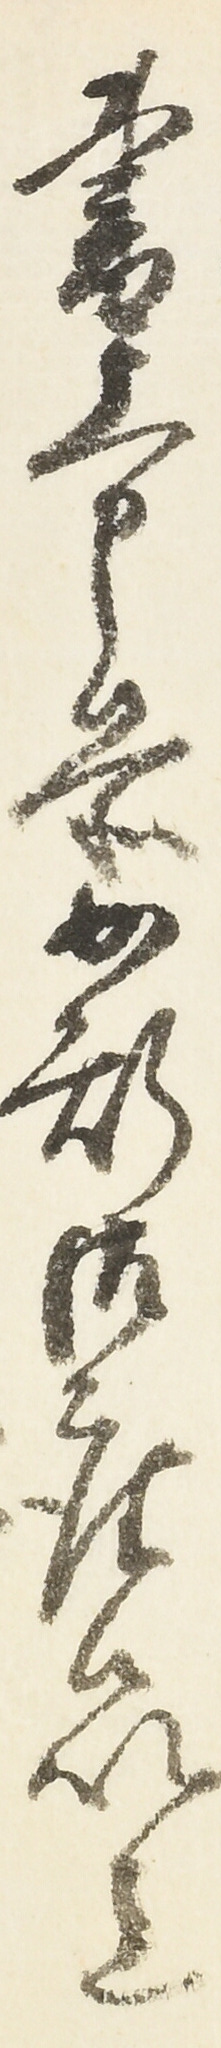書上申候所如斯御座候以上
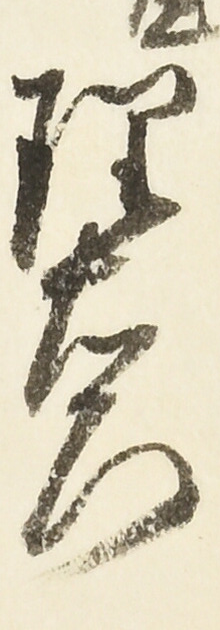平右衛門

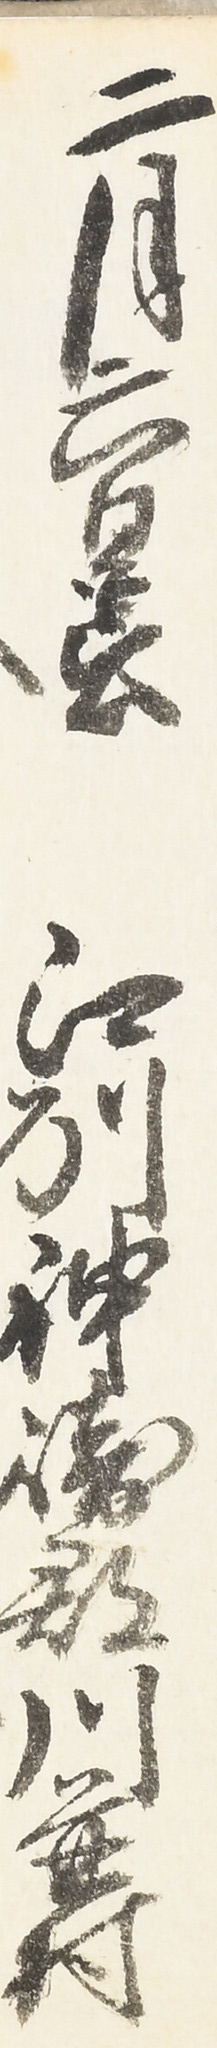二月六日着江州神崎郡川並村
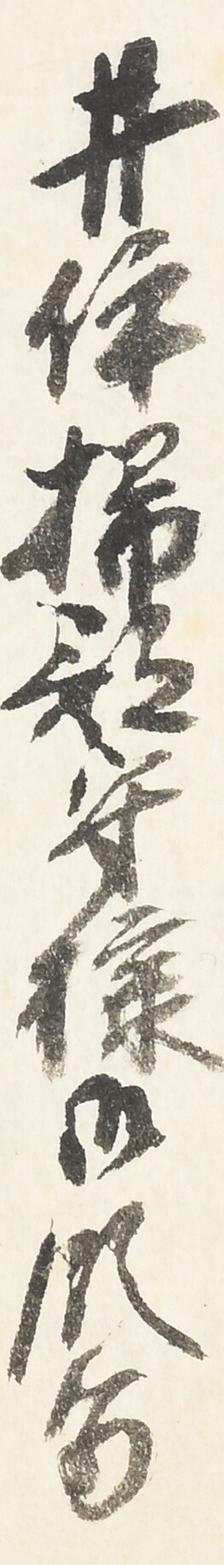井伊掃部守様御領分
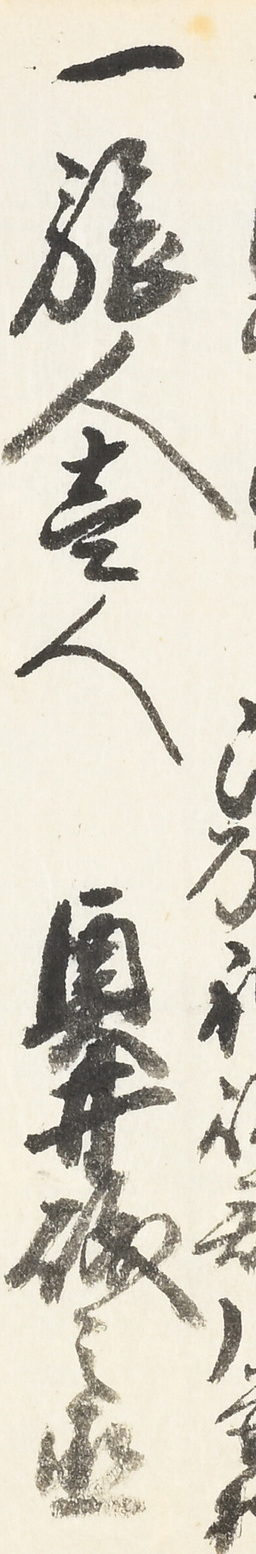一旅人壱人奥井磯之丞
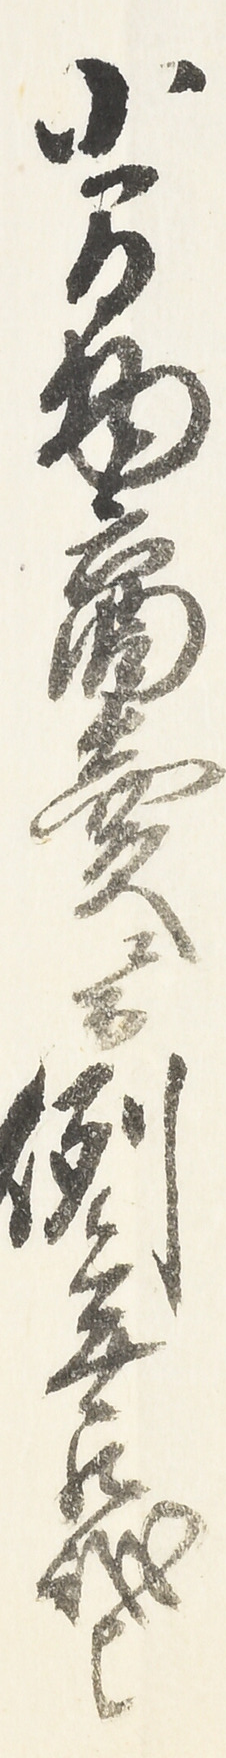小間物商売ニ而例年罷越申候
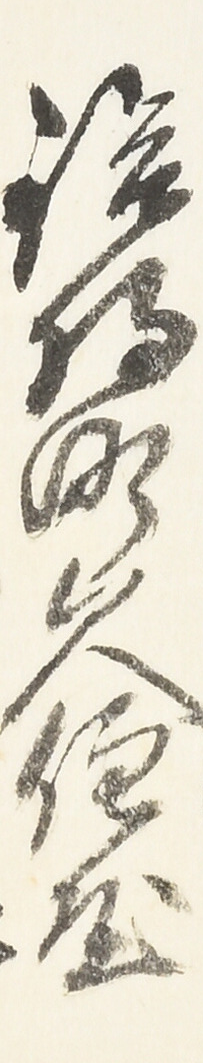鉾持町久住屋
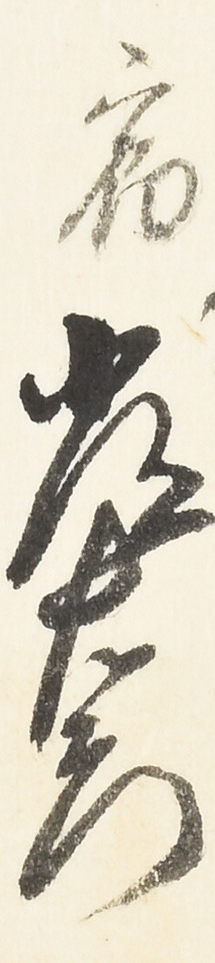宿常右衛門
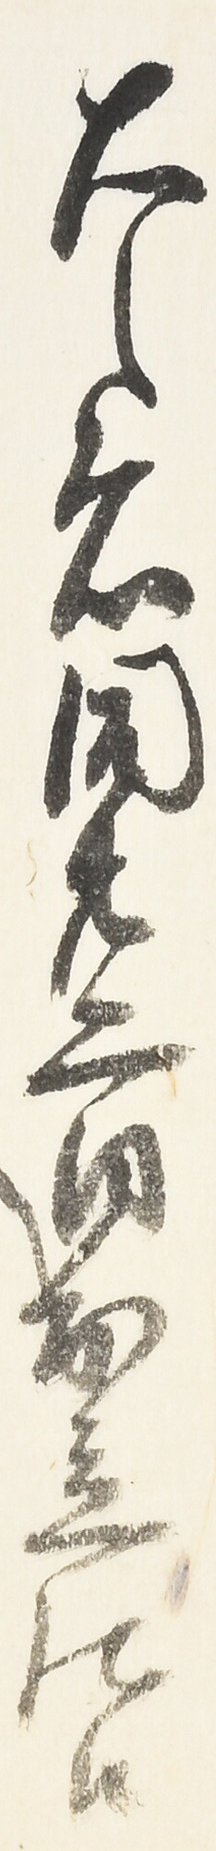右之者廿二日出立仕候
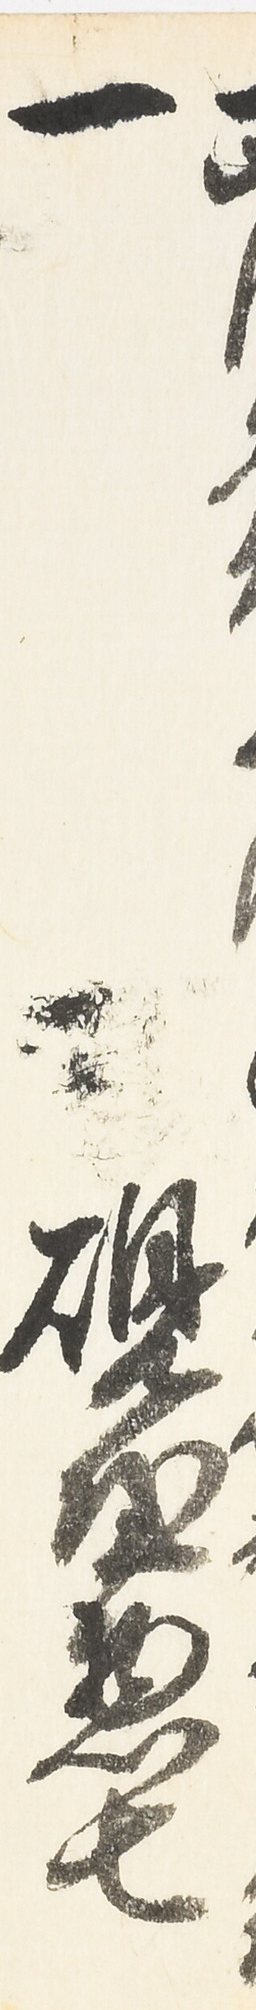一硯屋惣七
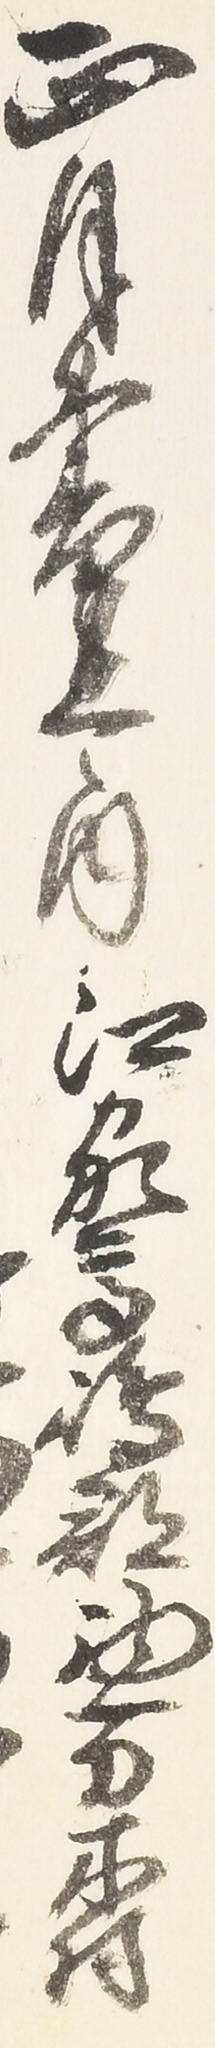正月書上之内江州高嶋郡西万木村
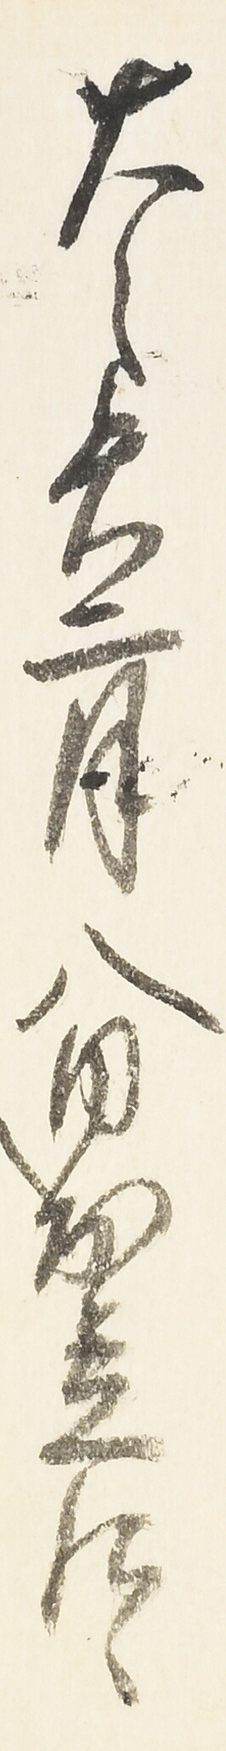右之者二月八日出立仕候
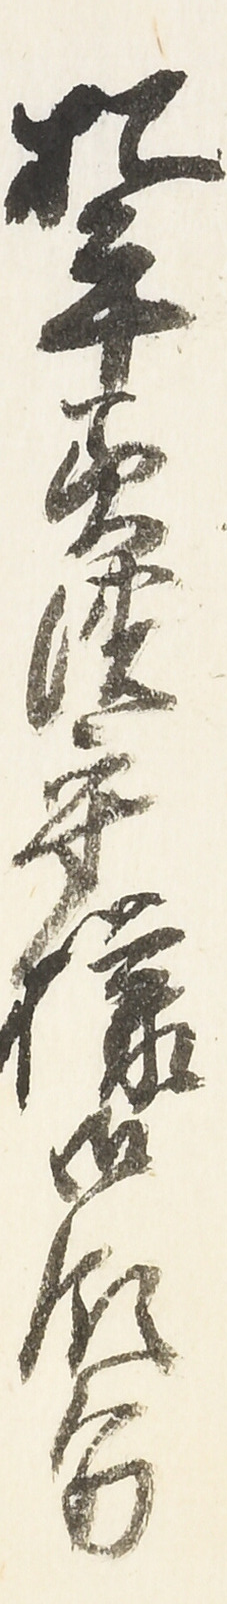松平美濃守様御領分
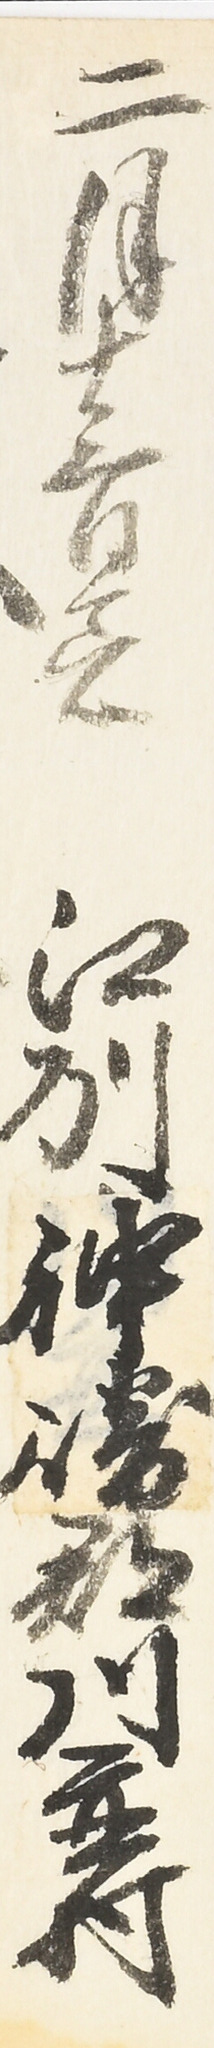二月十三日着江州神崎郡川並村
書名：町中旅人泊控帳
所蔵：伊那市立高遠町図書館・合同会社AMANE
